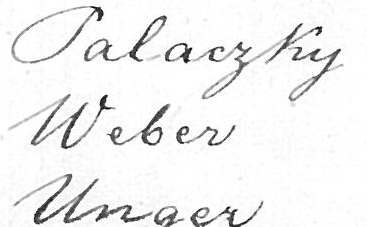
Palaczky
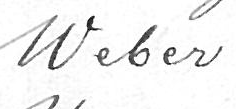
Weber
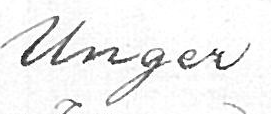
Unger
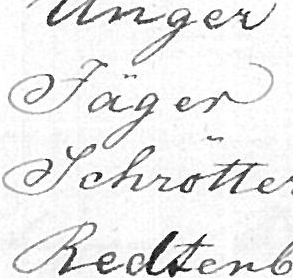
Jäger
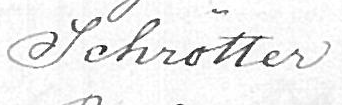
Schrötter
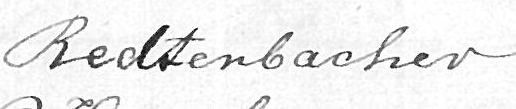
Redtenbacher
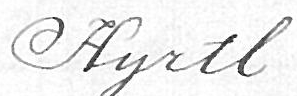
Hyrtl
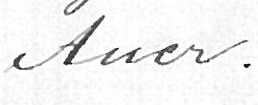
Auer
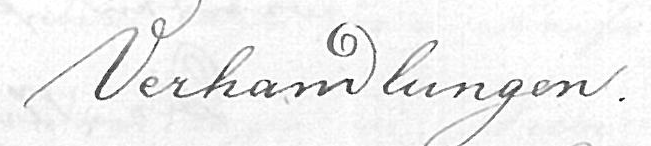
Verhandlungen.
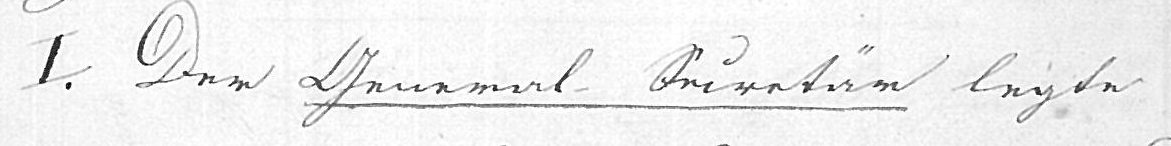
I. Der General-Secretär legte
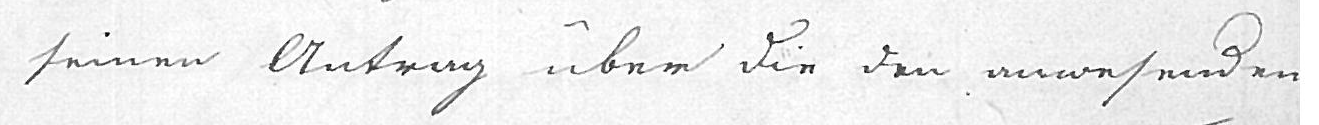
seinen Antrag über die den anwesenden
